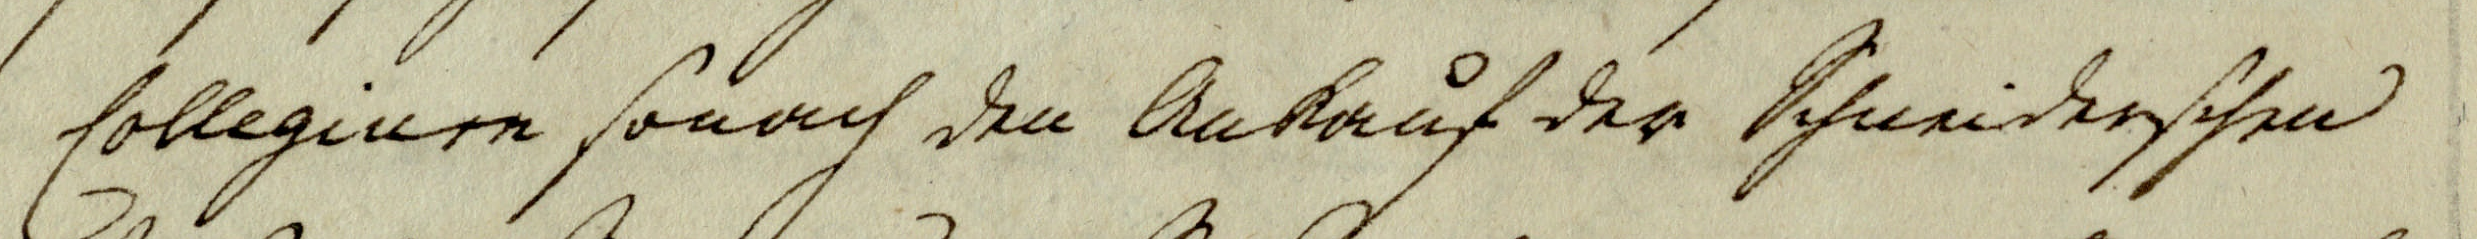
Collegium sonach den Ankauf der Schneiderschen
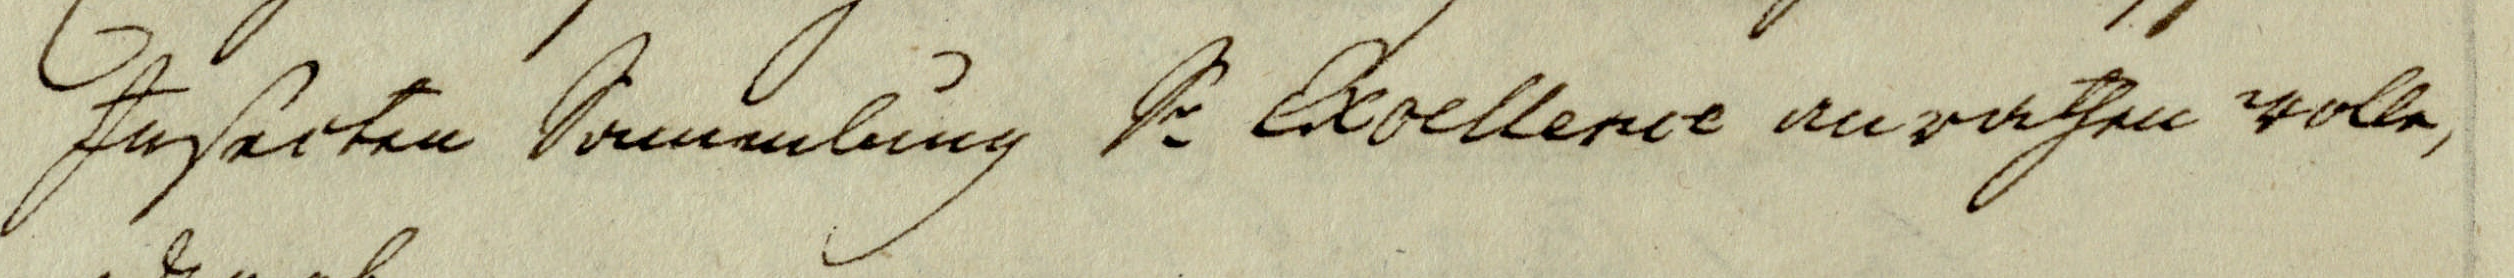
Insecten Sammlung Sr Excellence anrathen wolle,
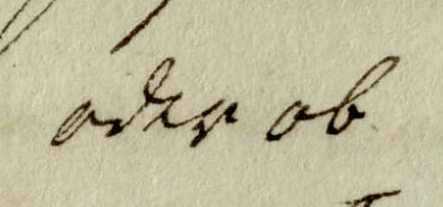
oder ob
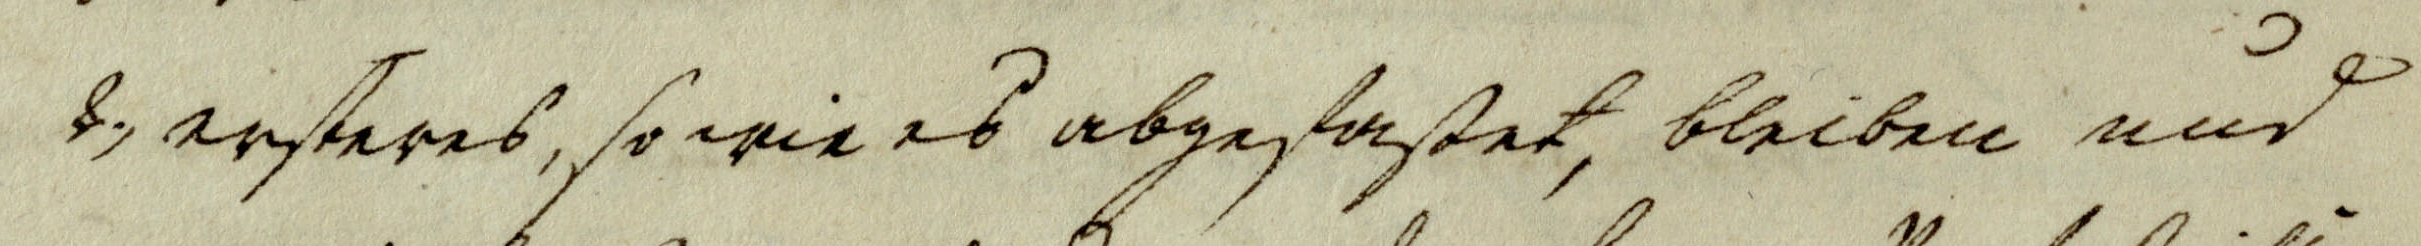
2, ersteres, so wie es abgefaßet, bleiben und
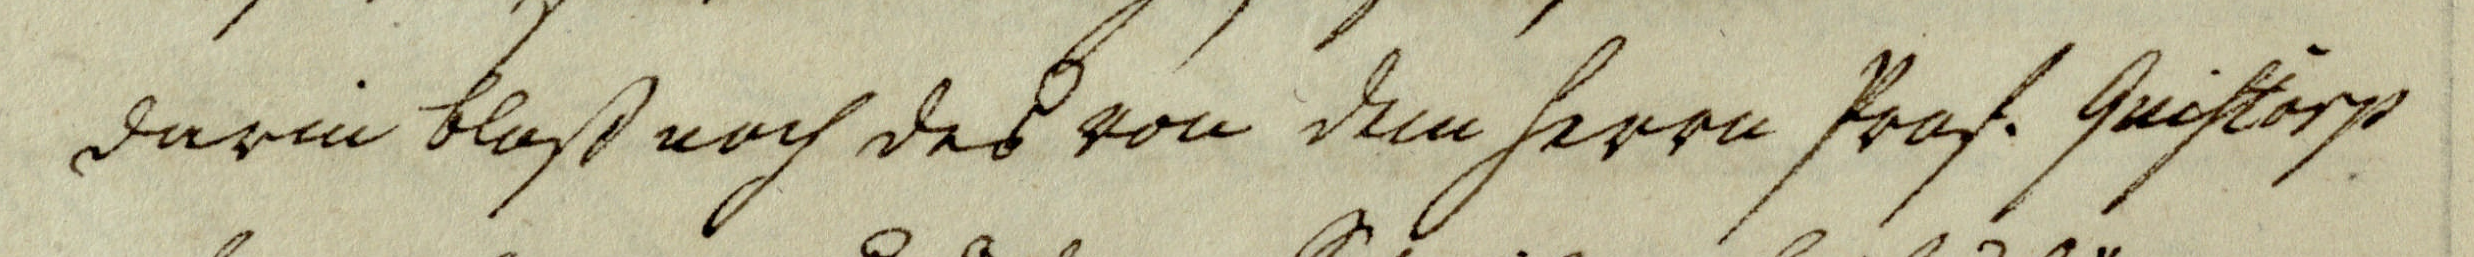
darin bloß noch des von dem Herrn Prof. Quistorp
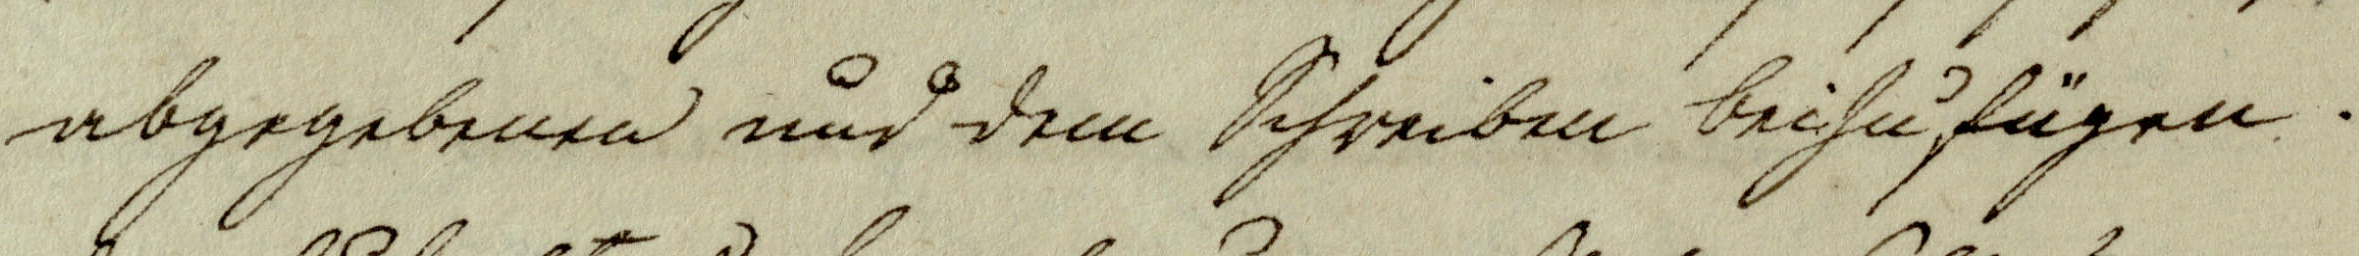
abgegebenen und dem Schreiben beizufügen¬
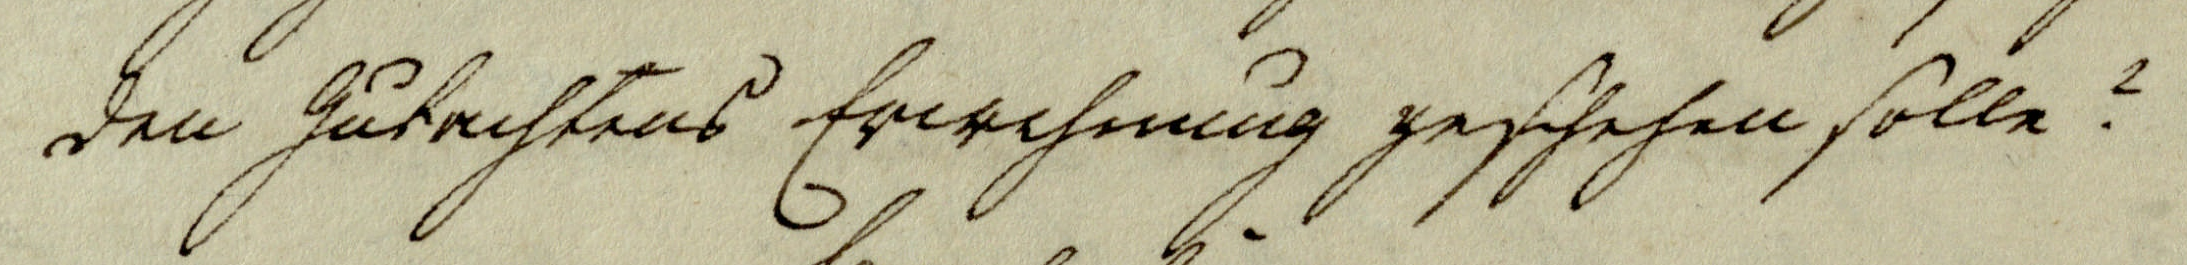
den Gutachtens Erwehnung geschehen solle?
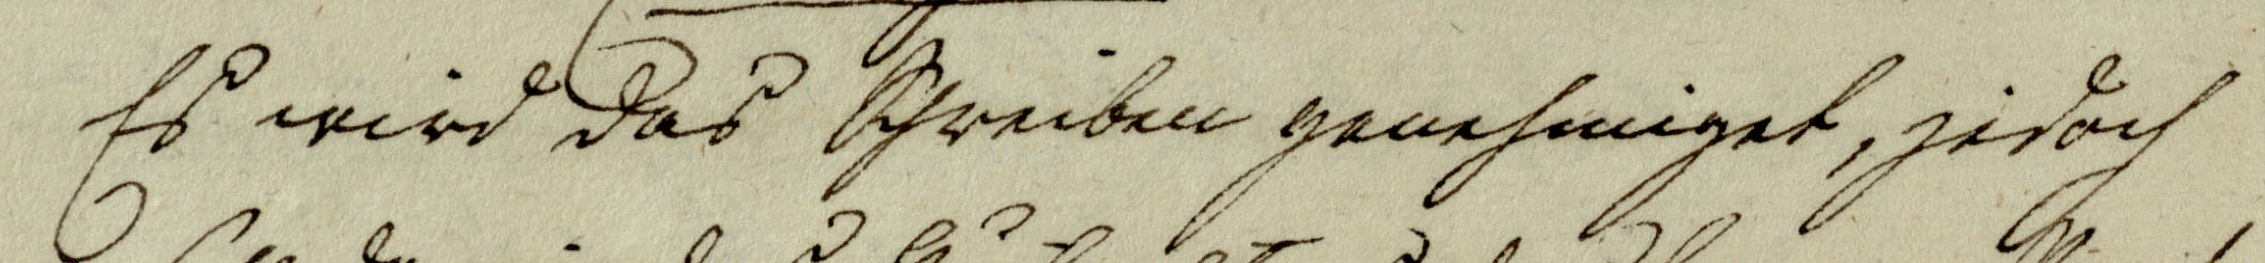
Es wird das Schreiben genehmiget, jedoch
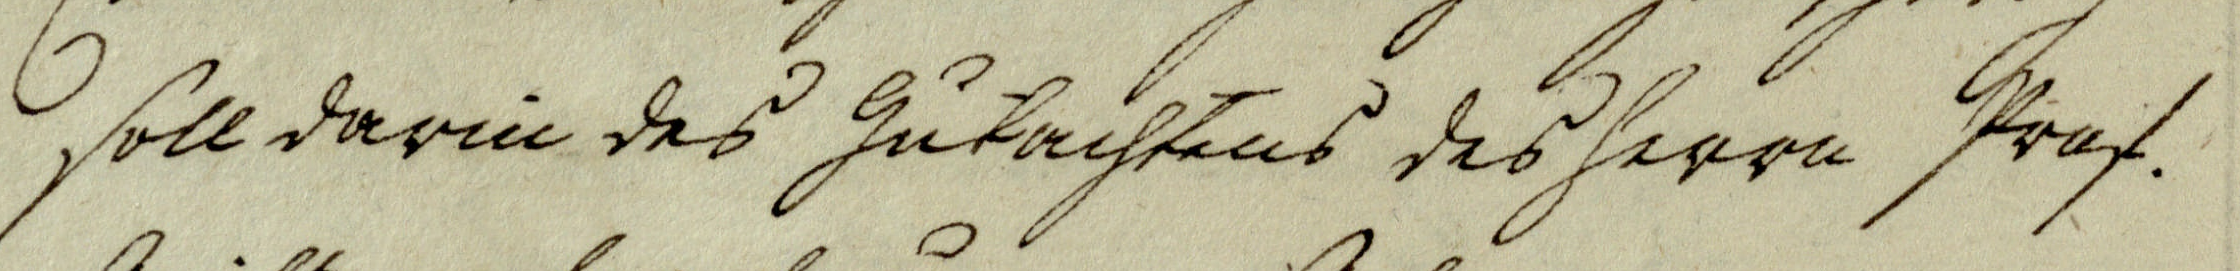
soll darin des Gutachtens des Herrn Prof.
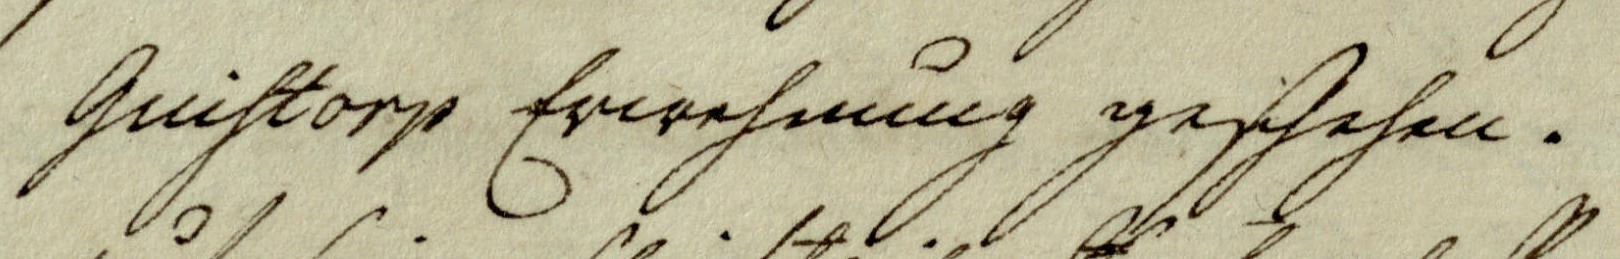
Quistorp Erwehnung geschehen.
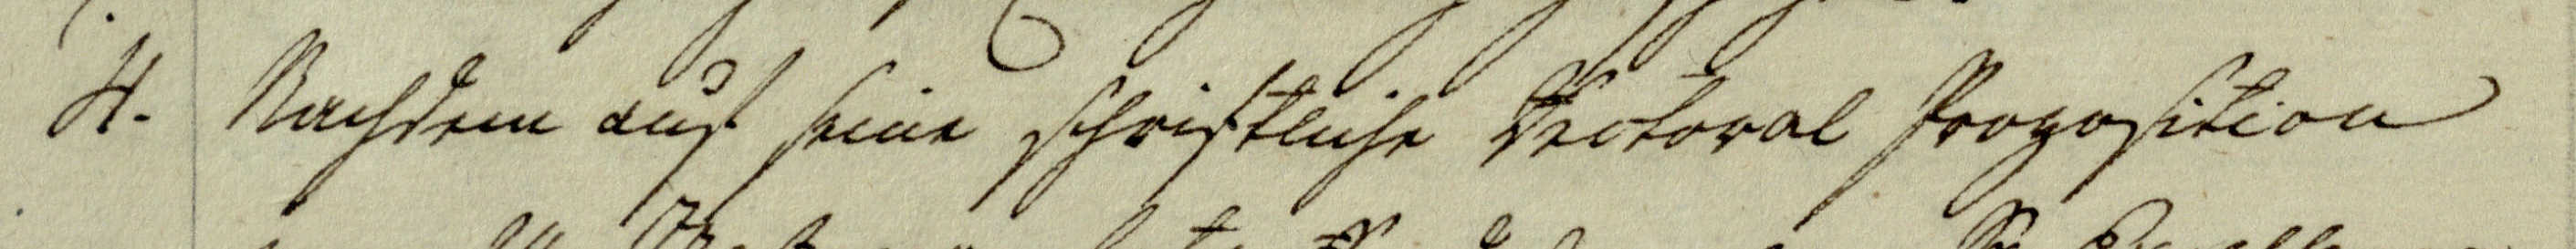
4. Nachdem auf seine schriftliche Rectoral Proposition
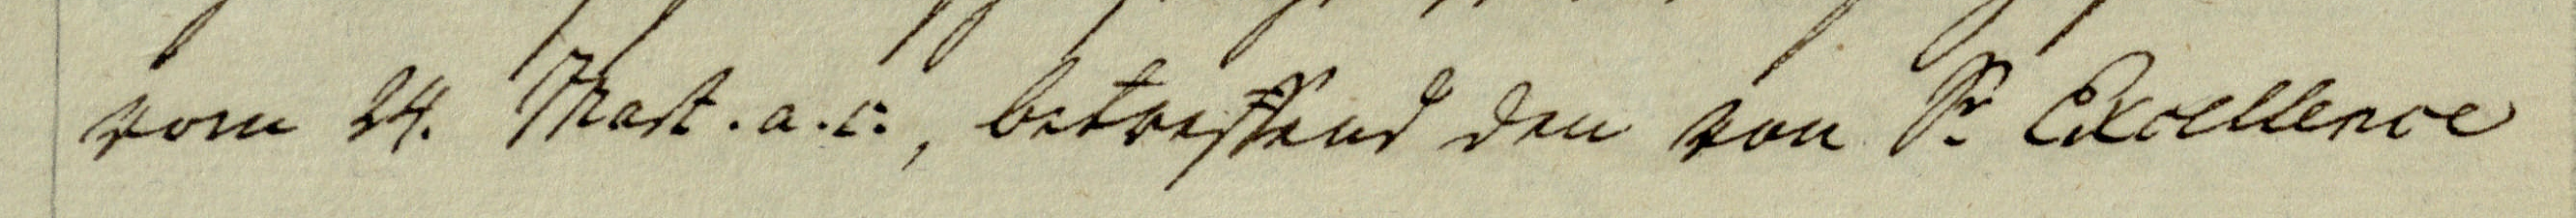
vom 24. Mart. a. c., betreffend den von Sr Excellence
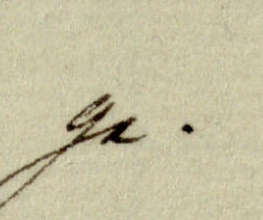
ge¬
